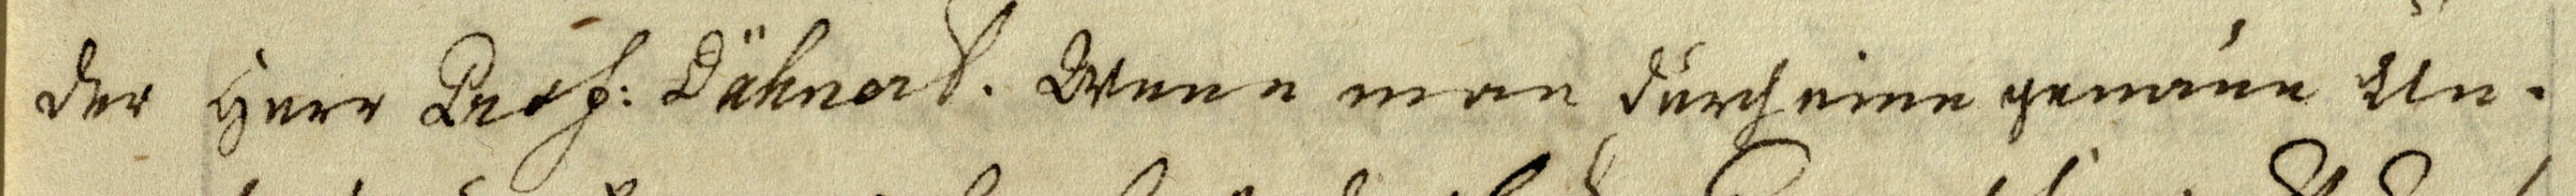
der Herr Prof. Dähnert. Wenn man durch eine genaue Un¬
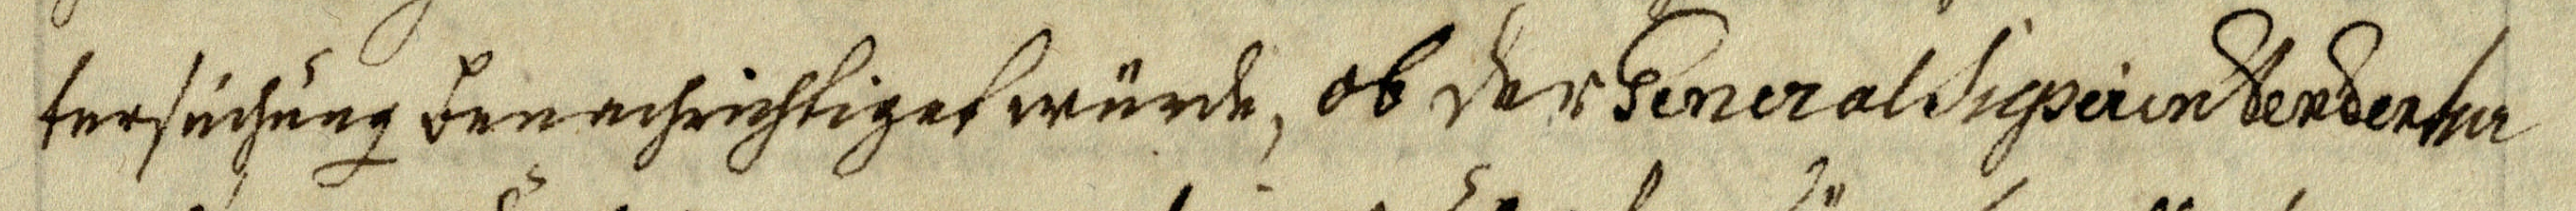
tersuchung benachrichtiget würde, ob der GeneralSuperintendentur
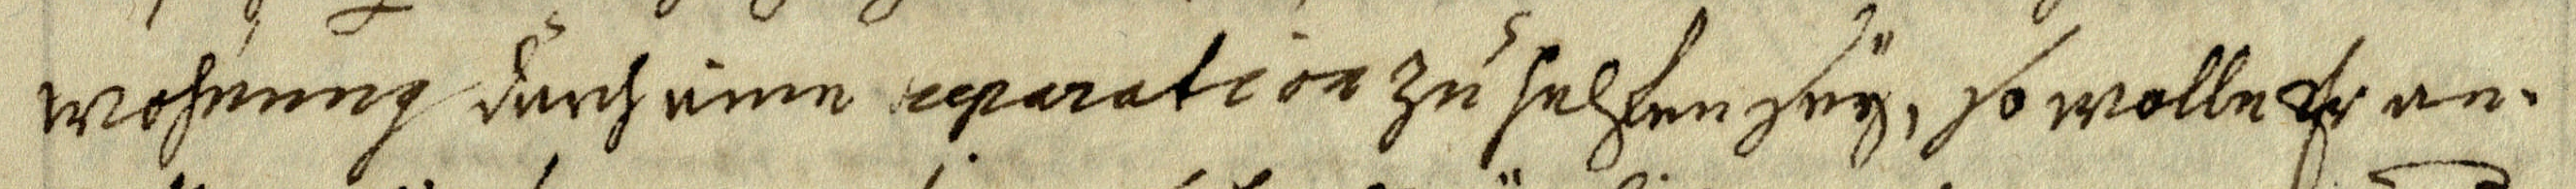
Wohnung durch eine reparation zu helfen seÿ, so wolle Er an¬
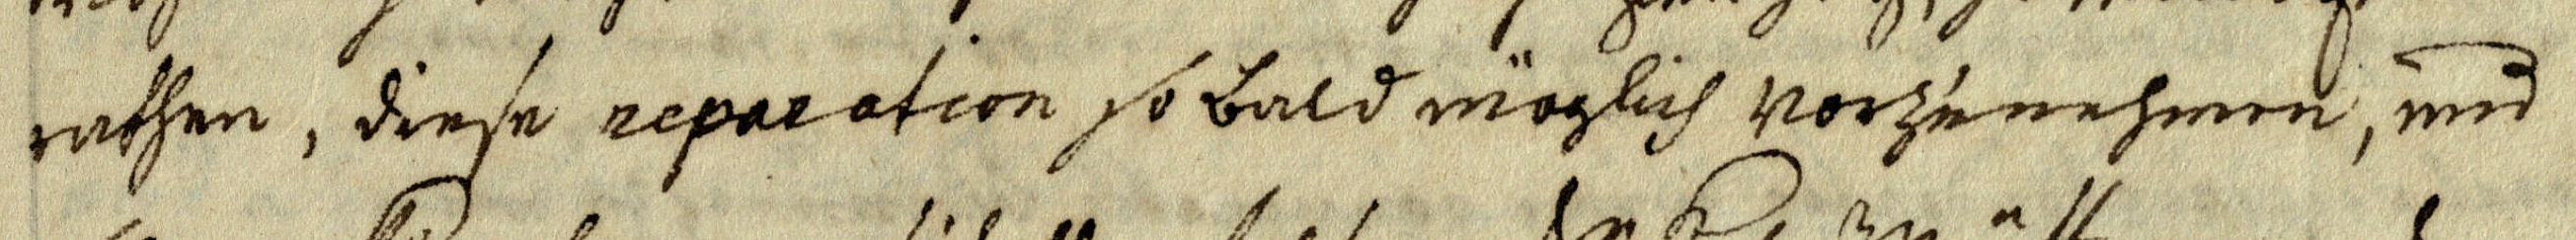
rathen, diese reparation so bald möglich vorzunehmen, und
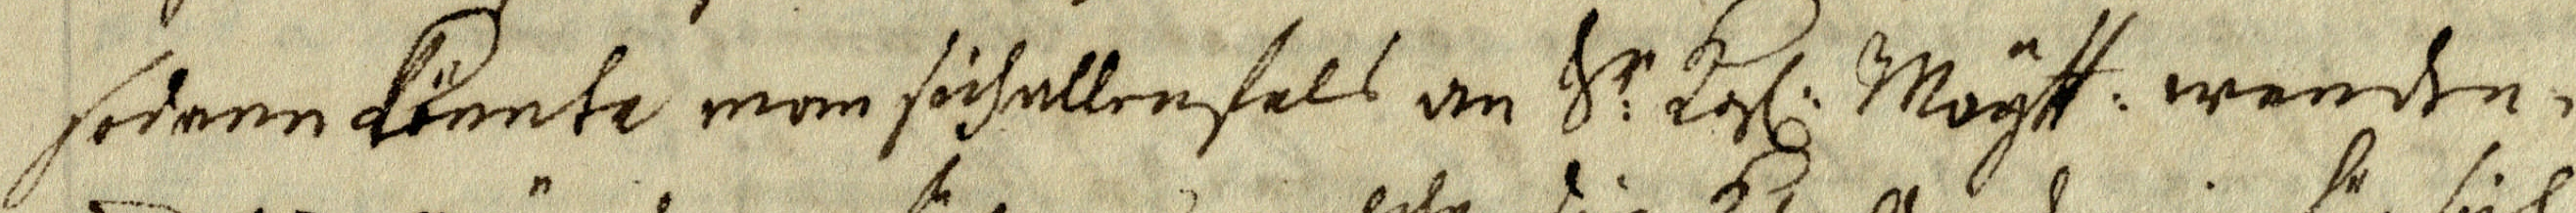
sodann könnte man sich allenfals an Sr. Kgl. Maÿtt. wenden,
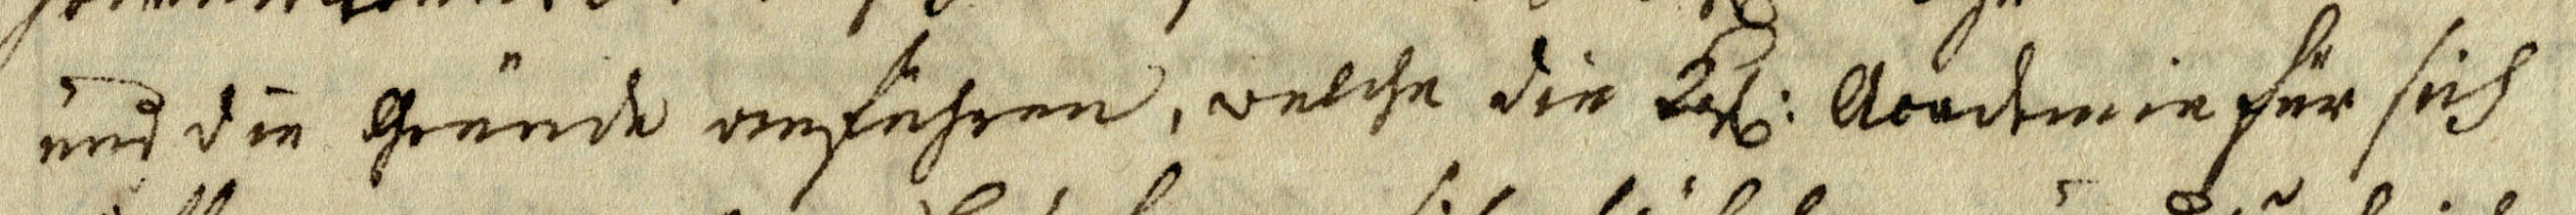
und die Gründe anführen, welche die Kgl. Academie für sich
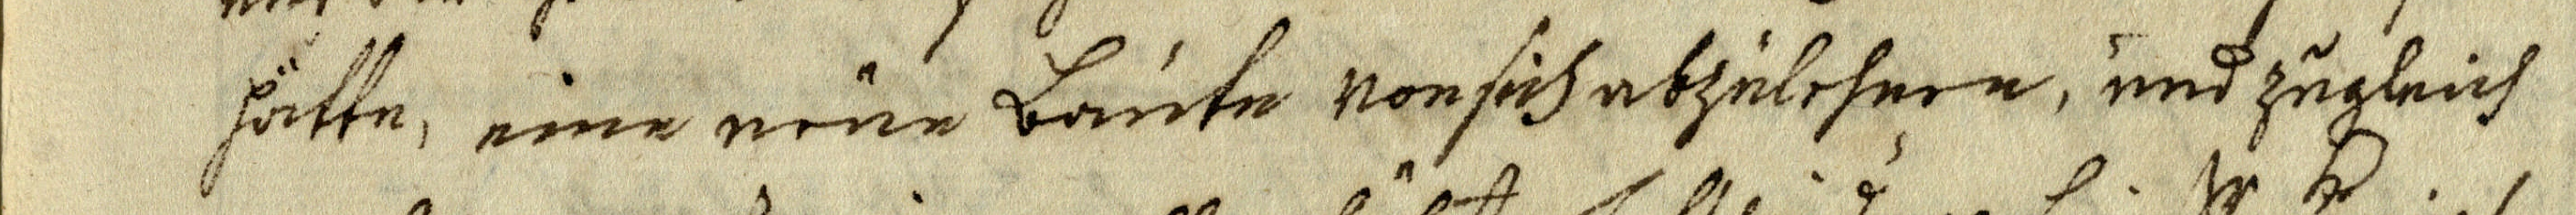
hätte, eine neue Baute von sich abzulehnen, und zugleich
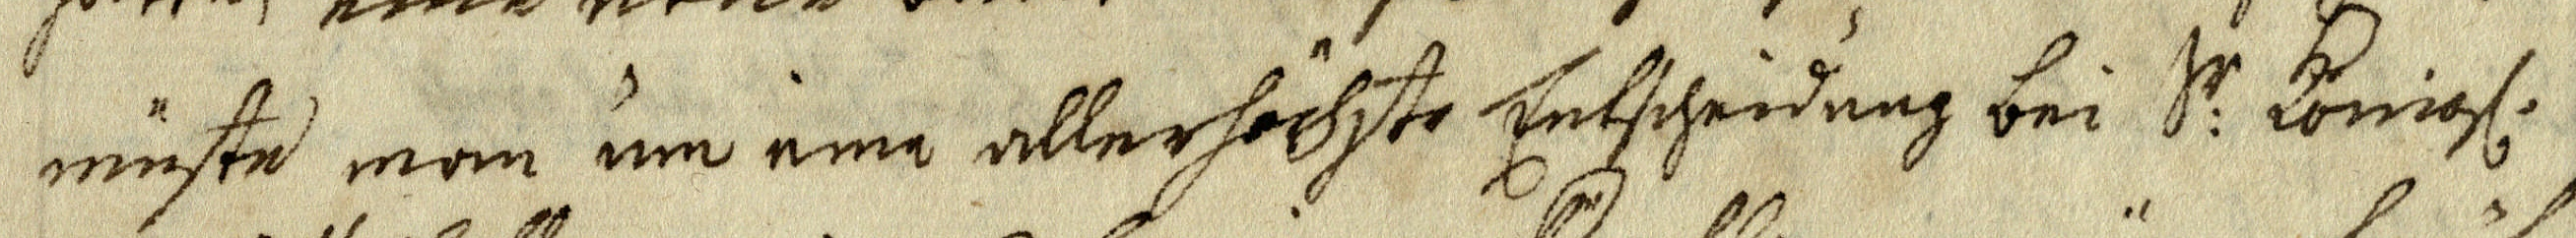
müste man um eine allerhöchste Entscheidung bei Sr. Königl.
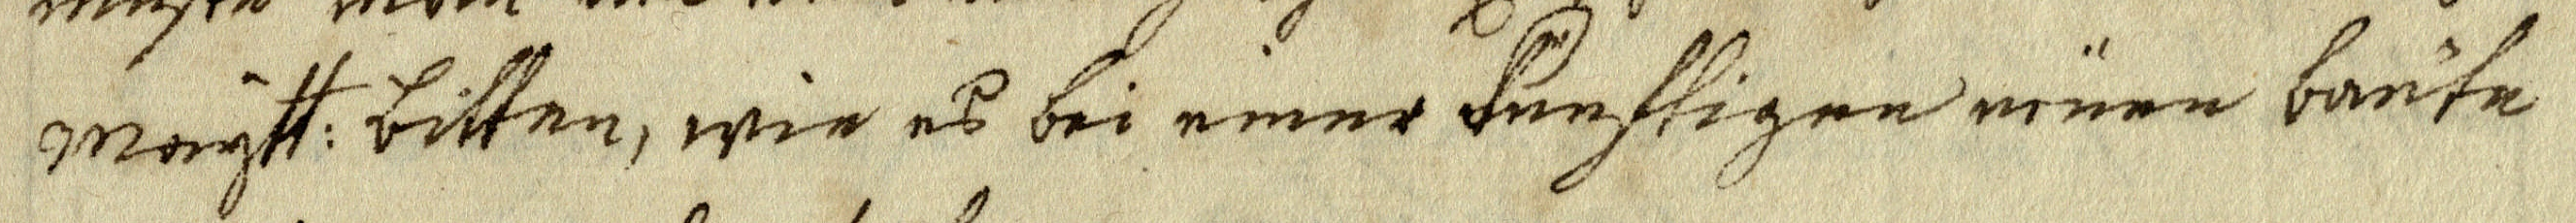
Maÿtt. bitten, wie es bei einer künftigen neuen Baute
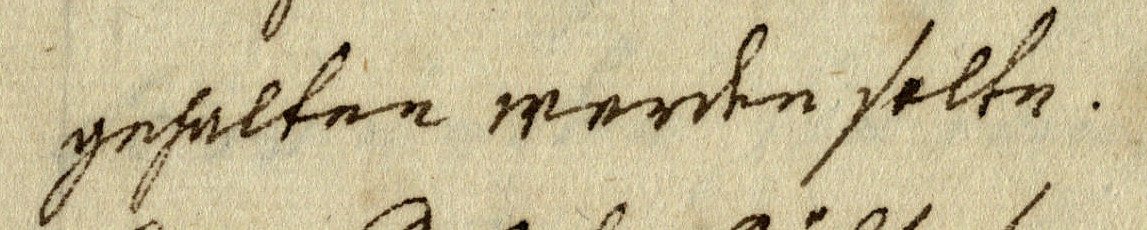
gehalten werden solte.
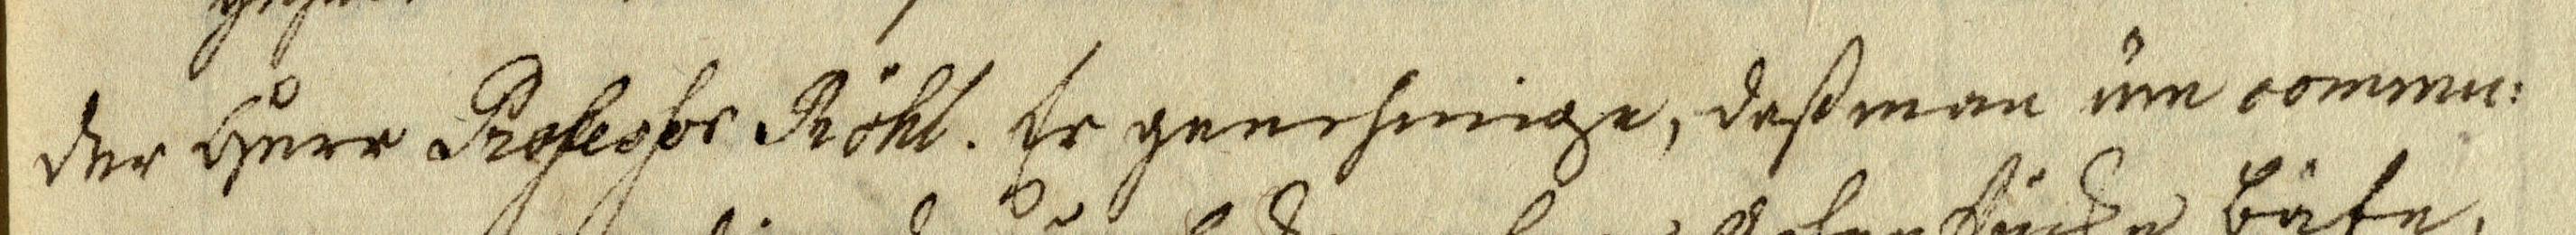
der Herr Professor Röhl. Er genehmige, daß man um commu¬
